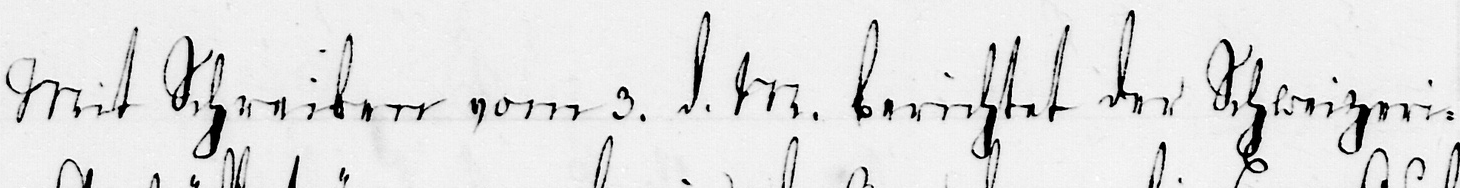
Mit Schreiben vom 3. d. M. berichtet der Schweizeris¬
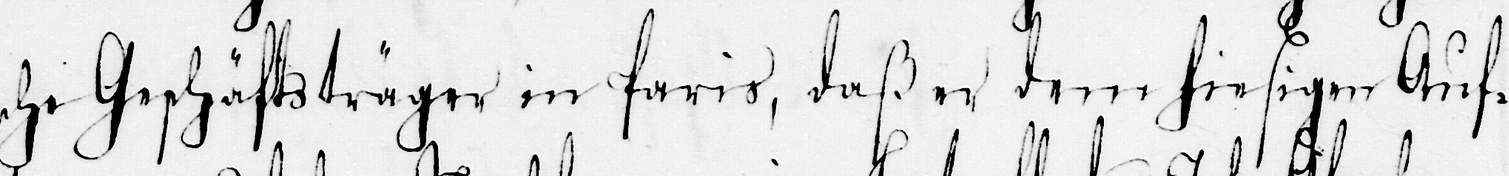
che Geschäftsträger in Paris, daß er dem hiesigen Auf¬
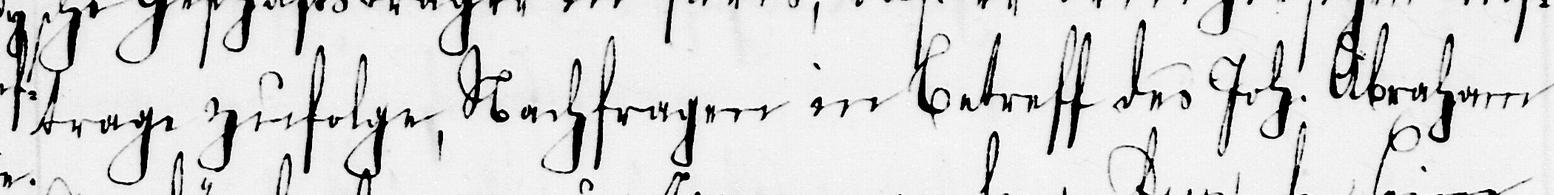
trage zufolge, Nachfragen in Betreff des Joh. Abraham
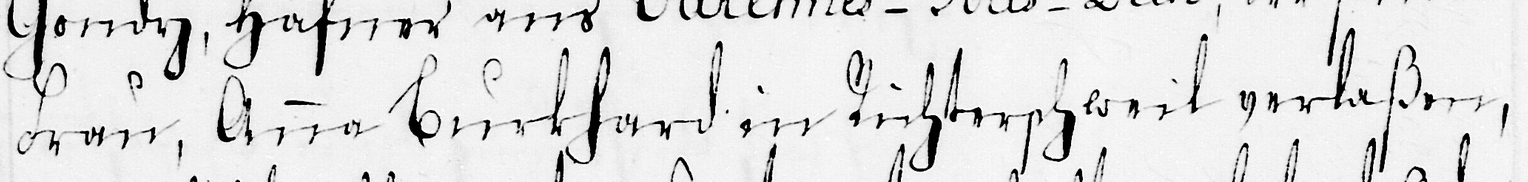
Frau, Anna Burkhard in Richterschweil verlaßen,
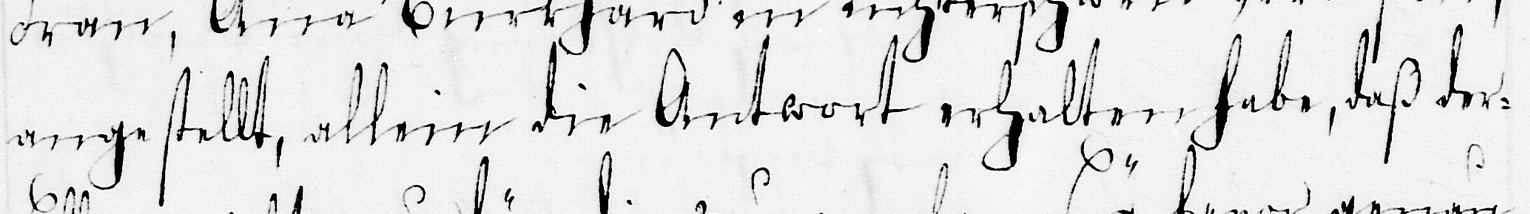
angestellt, allein die Antwort erhalten habe, daß der¬
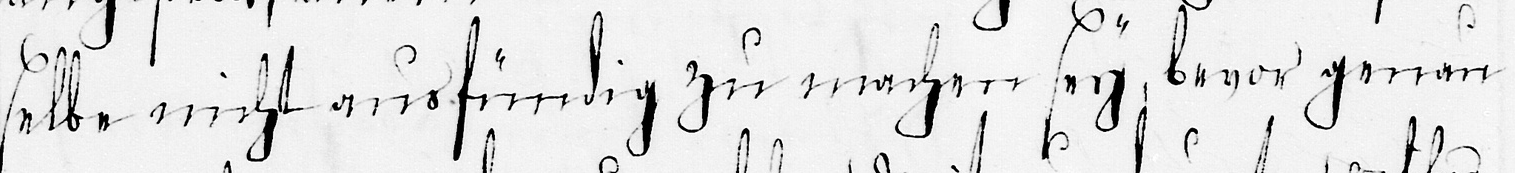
selbe nicht ausfündig zu machen sey, bevor genau
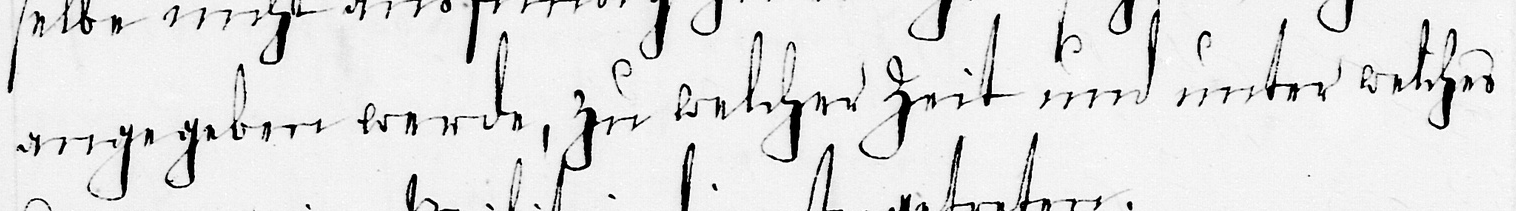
angegeben werde, zu welcher Zeit und unter welches
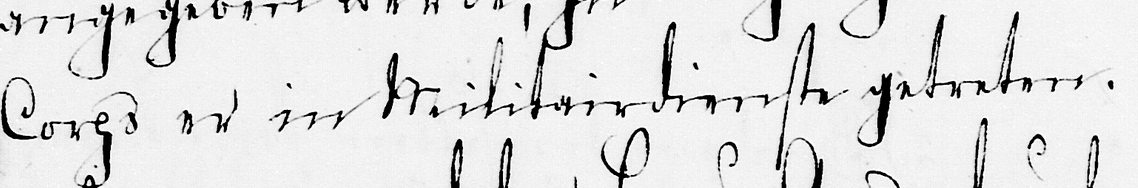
Corps er in Militairdienste getreten.
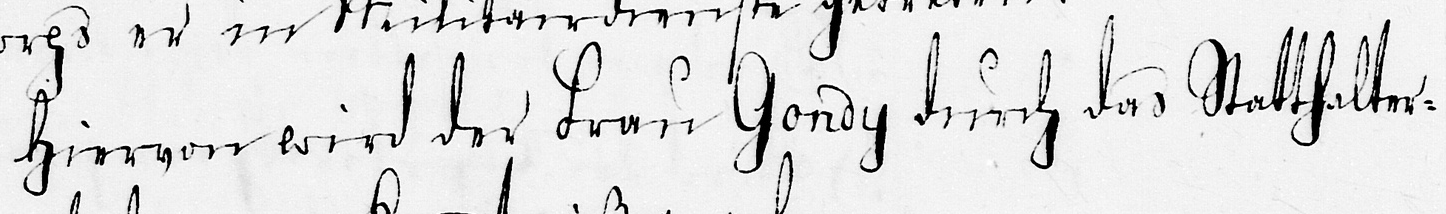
Hiervon wird der Frau Gondy durch das Statthalte¬
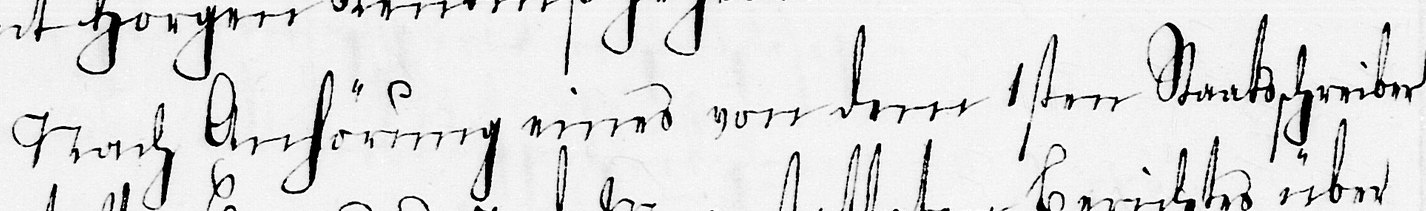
Nach Anhörung eines von dem 1sten Staatsschreiber
